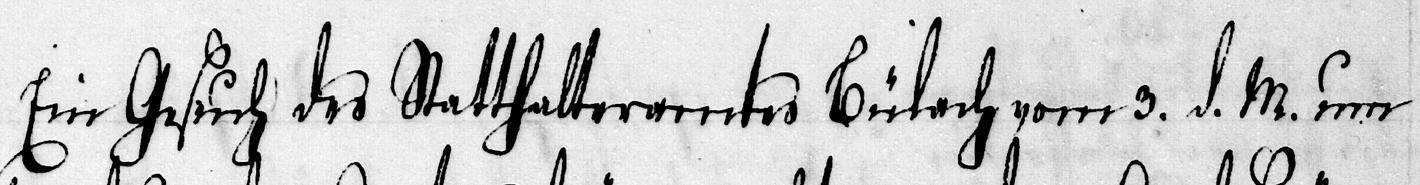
Ein Gesuch des Statthalteramtes Bülach vom 3. d. M. um
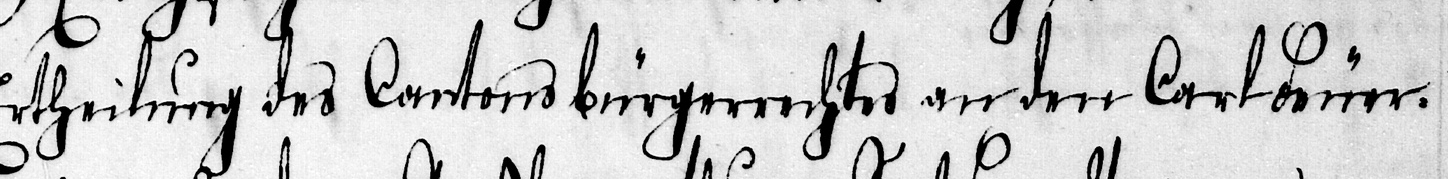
Ertheilung des Cantonsbürgerrechtes an den Carl Feuer¬
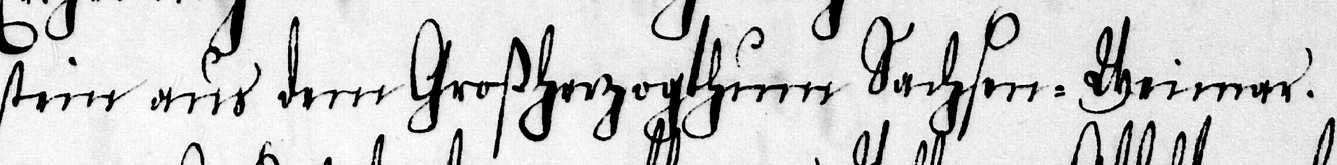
stein aus dem Großherzogthum Sachsen-Weimar.
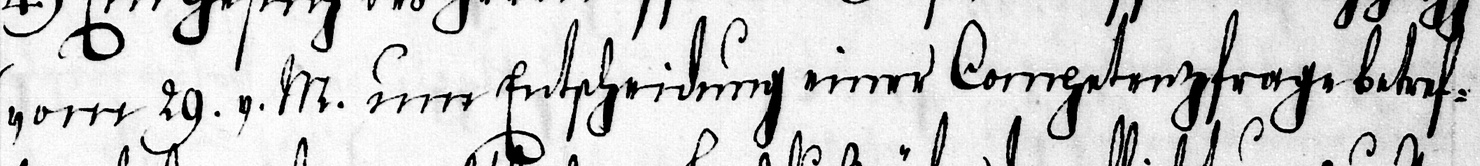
vom 29. v. M. um Entscheidung einer Competenzfrage betref¬
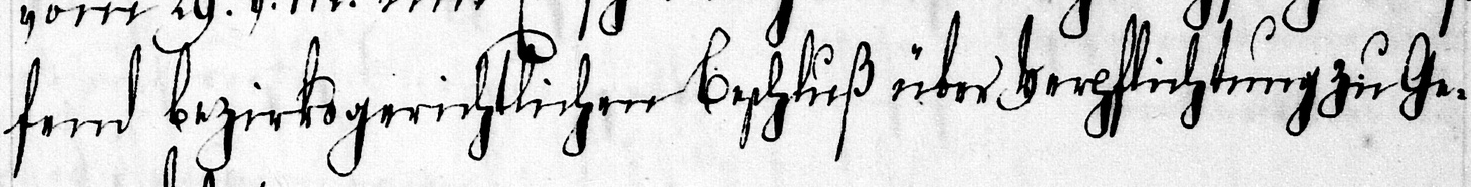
fend bezirksgerichtlichen Beschluß über Verpflichtung zu Ge¬
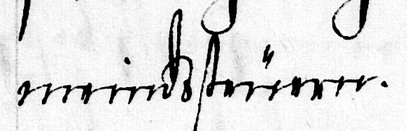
meindssteuern.
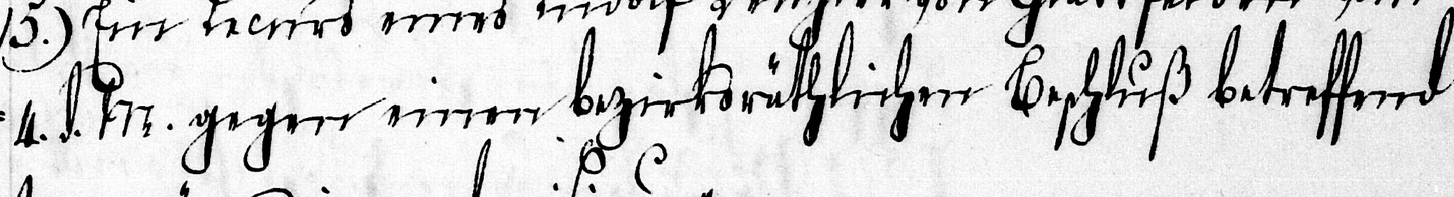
4. d. M. gegen einen bezirksräthlichen Beschluß betreffend
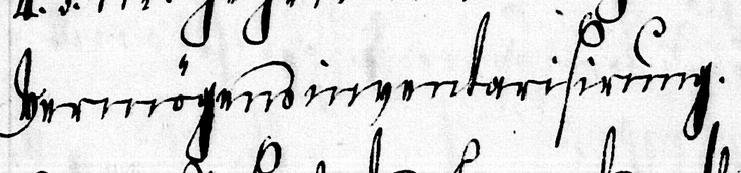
Vermögensinventarisirung.
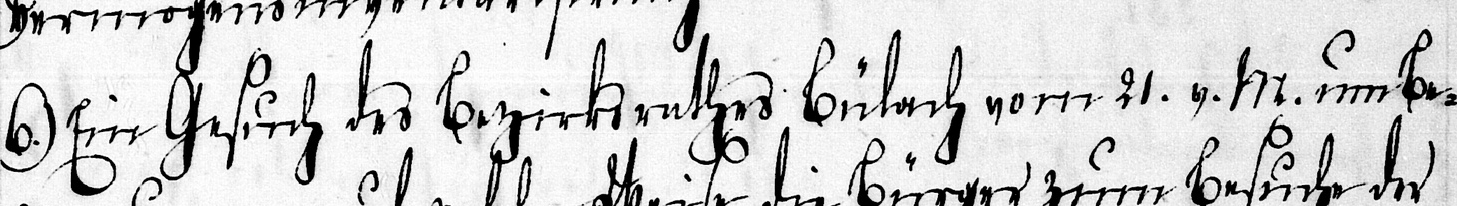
6.) Ein Gesuch des Bezirksrathes Bülach vom 21. v. M. um Be¬
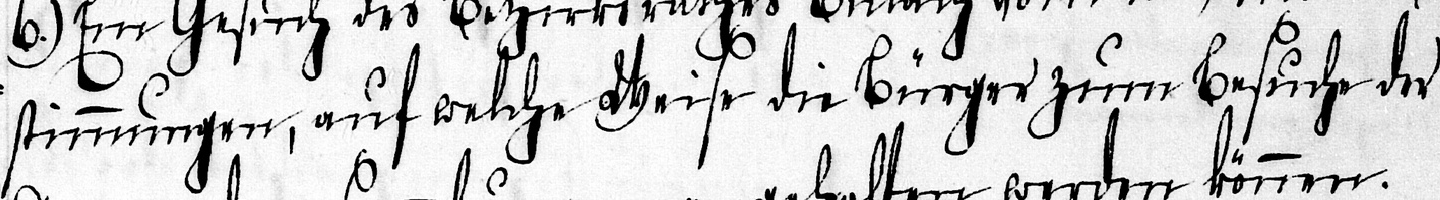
stimmungen, auf welche Weise die Bürger zum Besuche der
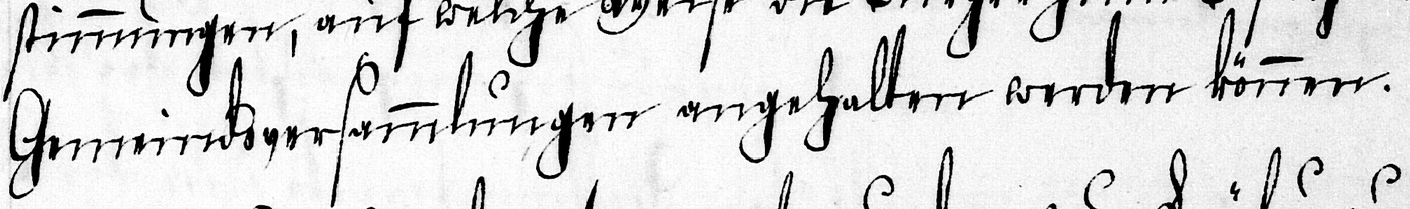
Gemeindsversammlungen angehalten werden können.
